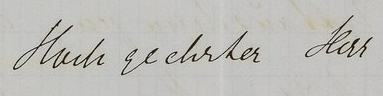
Hoch geehrter Herr
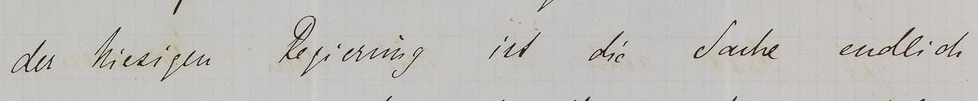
der hiesigen Regierung ist die Sache endlich
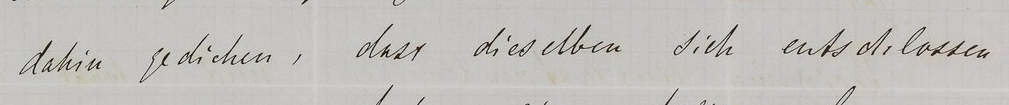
dahin gediehen, dass dieselben sich entschlossen
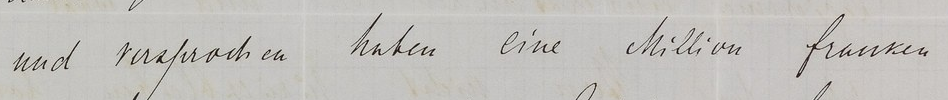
und versprochen haben eine Million Franken
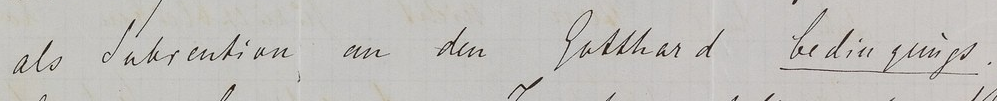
als Subvention an den Gotthardbedingungs-
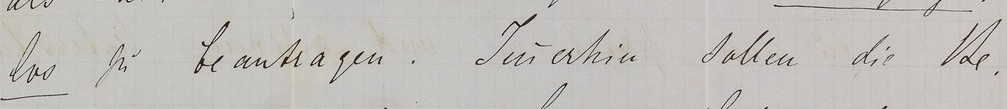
los zu beantragen. Immerhin sollen die Be-
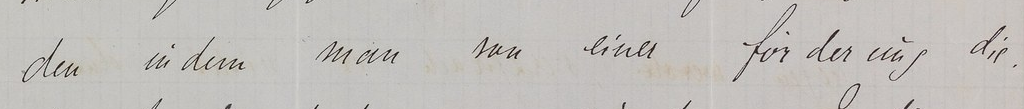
den indem man von einer Förderung die-
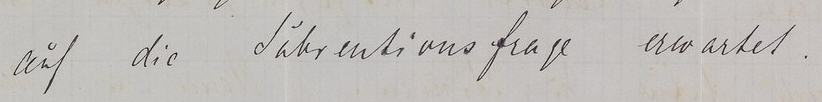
auf die Subventionsfrage erwartet.
